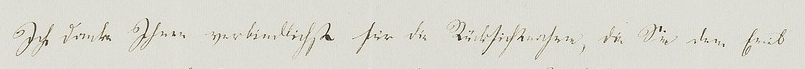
Ich danke Ihnen verbindlichst für die Rücksichtnahme, die Sie dem Emil
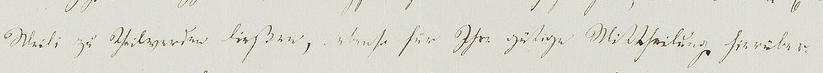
Meili zu theilwerden ließen, ebenso für Ihre gütige Mittheilung hierüber.
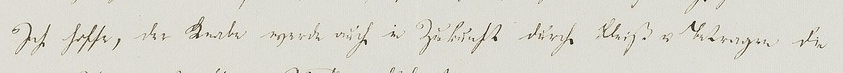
Ich hoffe, der Knabe werde auch in Zukunft durch Fleiß & Betragen die
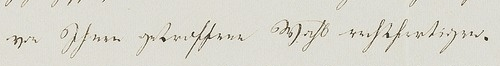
von Ihnen getroffene Wahl rechtfertigen.
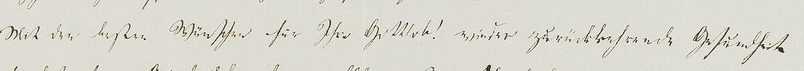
Mit den besten Wünschen für Ihre Gottlob! wieder zurückkehrende Gesundheit
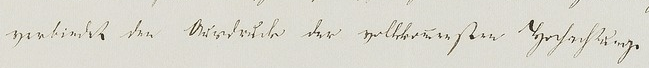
verbindet den Ausdruck der vollkommensten Hochachtung.
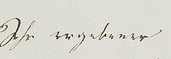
Ihr ergebener
